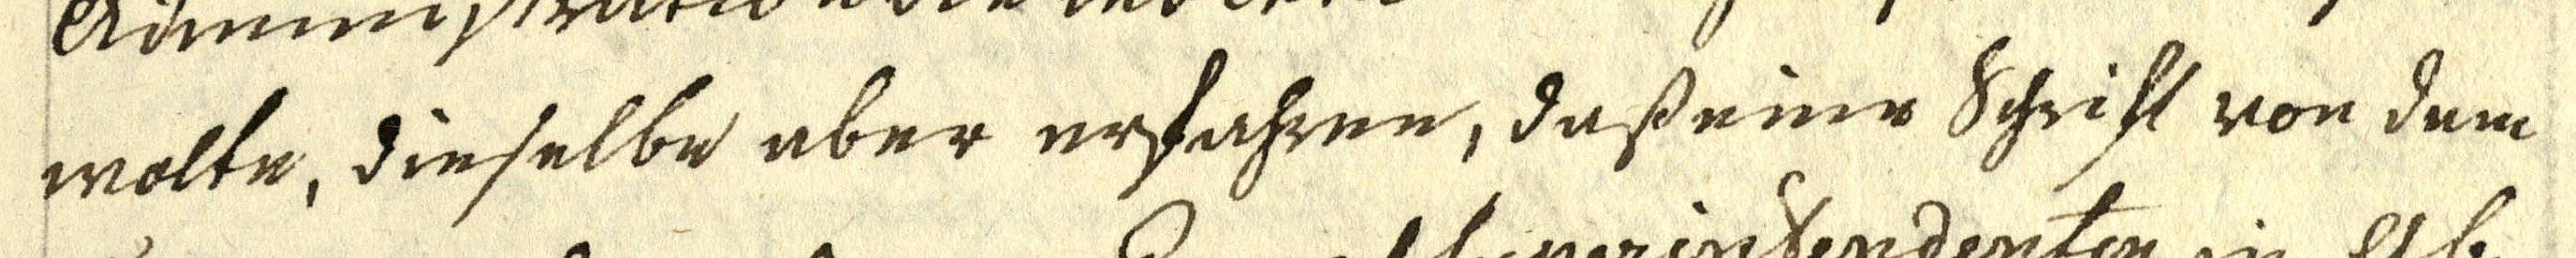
wolte, dieselbe aber erfahren, daß eine Schrift von dem
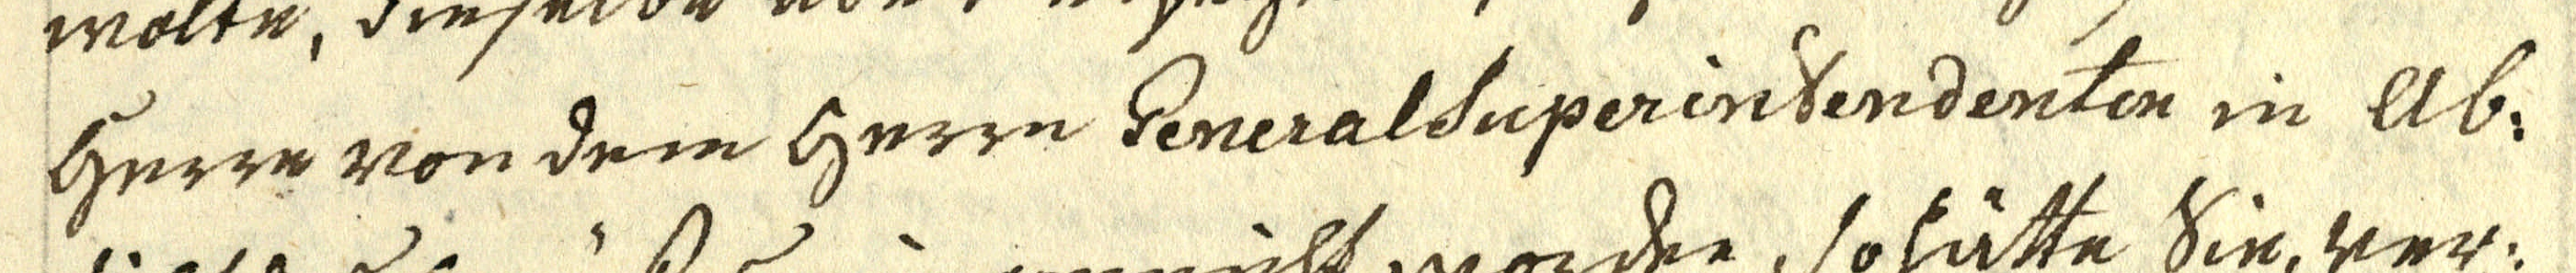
Herrn von dem Herrn GeneralSuperintendenten in Ab¬
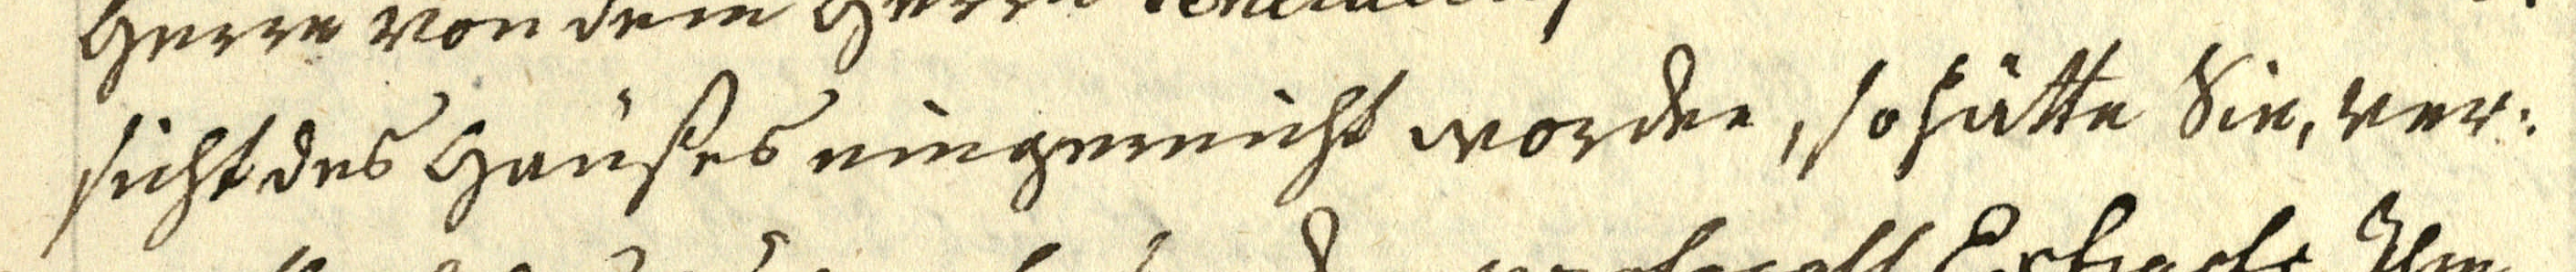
sicht des Haußes eingereicht worden, so hätte Sie, ver¬
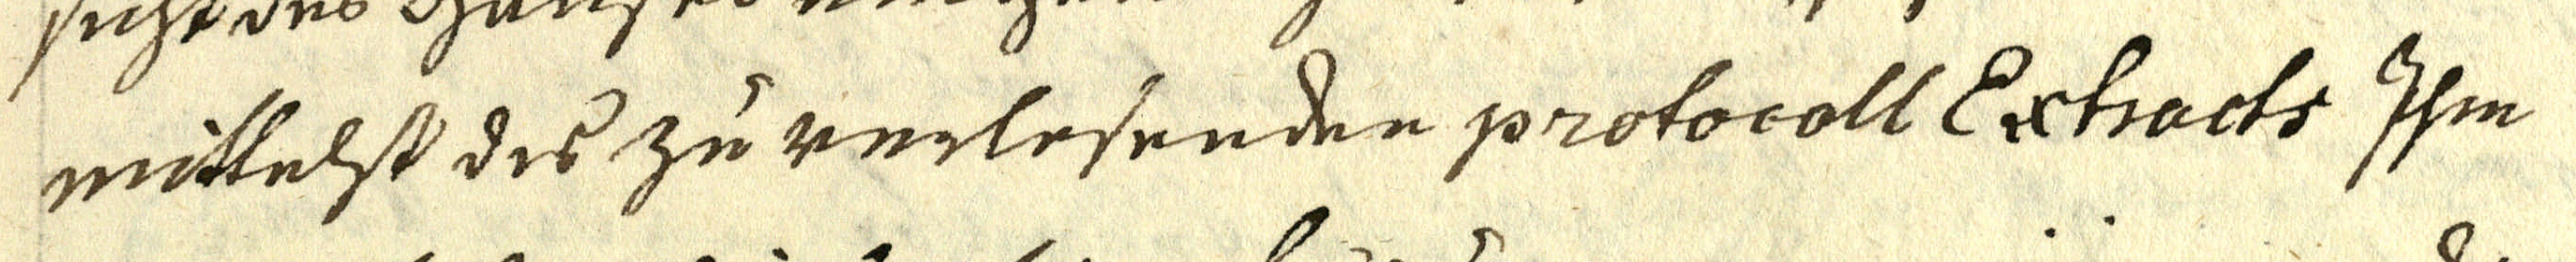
mittelst des zu verlesenden protocoll Extracts Ihm
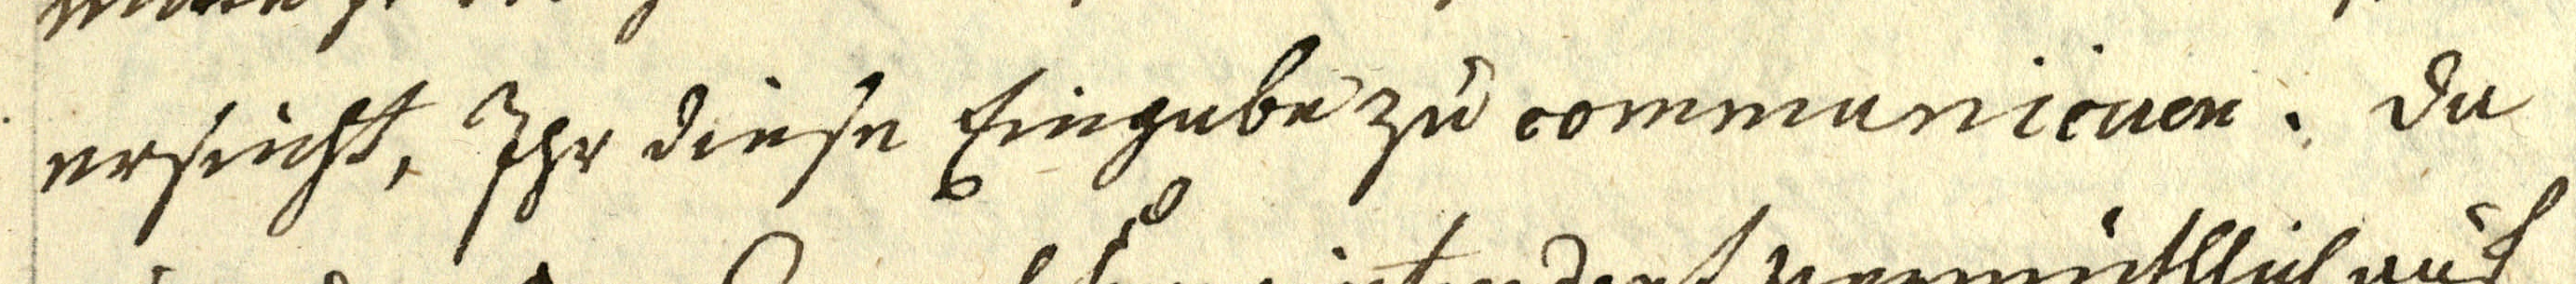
ersucht, Ihr diese Eingabe zu communiciren. Da
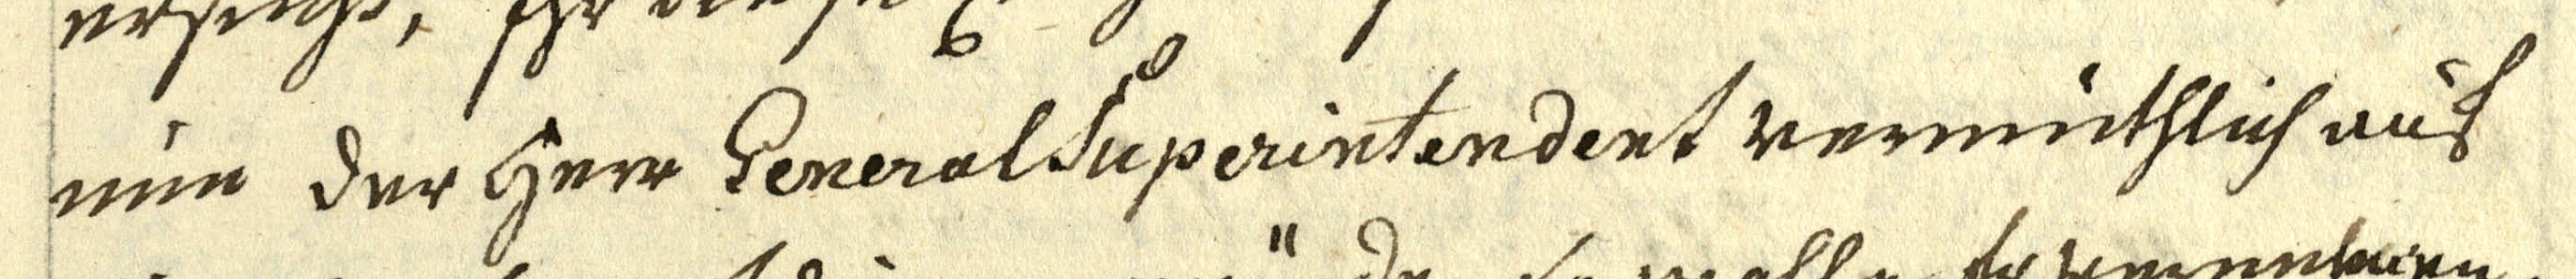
nun der Herr GeneralSuperintendent vermuthlich auf
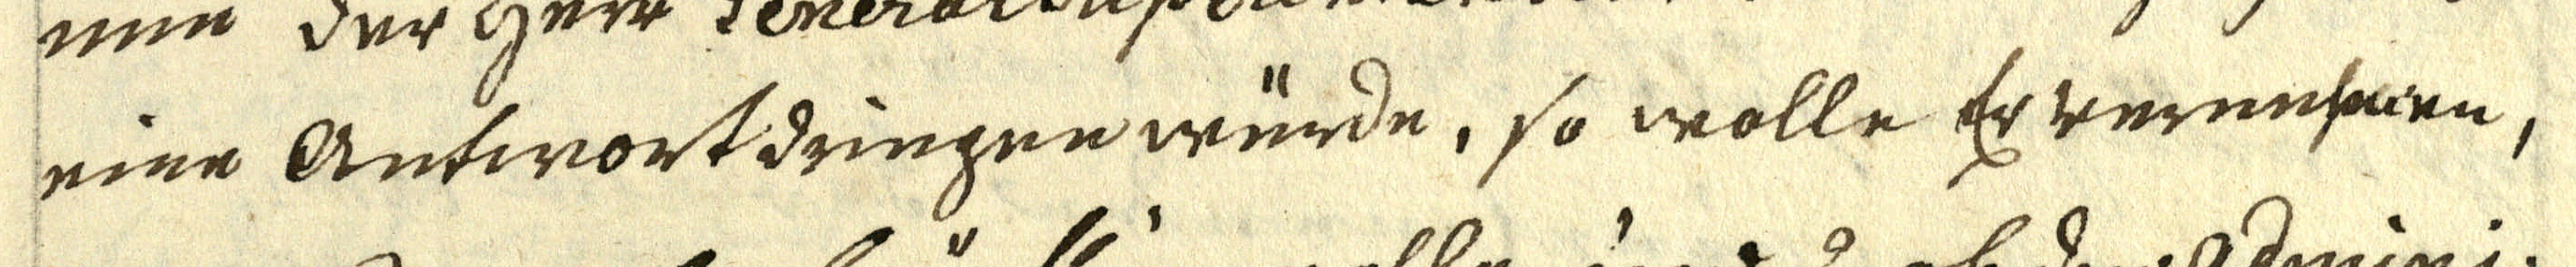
eine Antwort dringen würde, so wolle Er vernehmen,
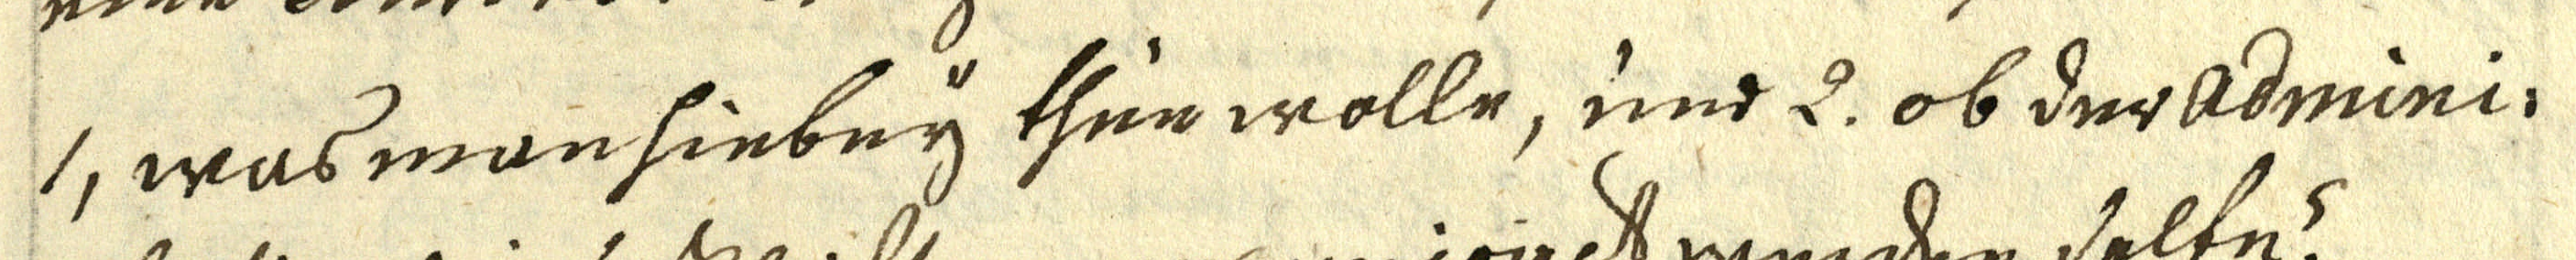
1, was man hiebeÿ thun wolle, und 2. ob der Admini¬
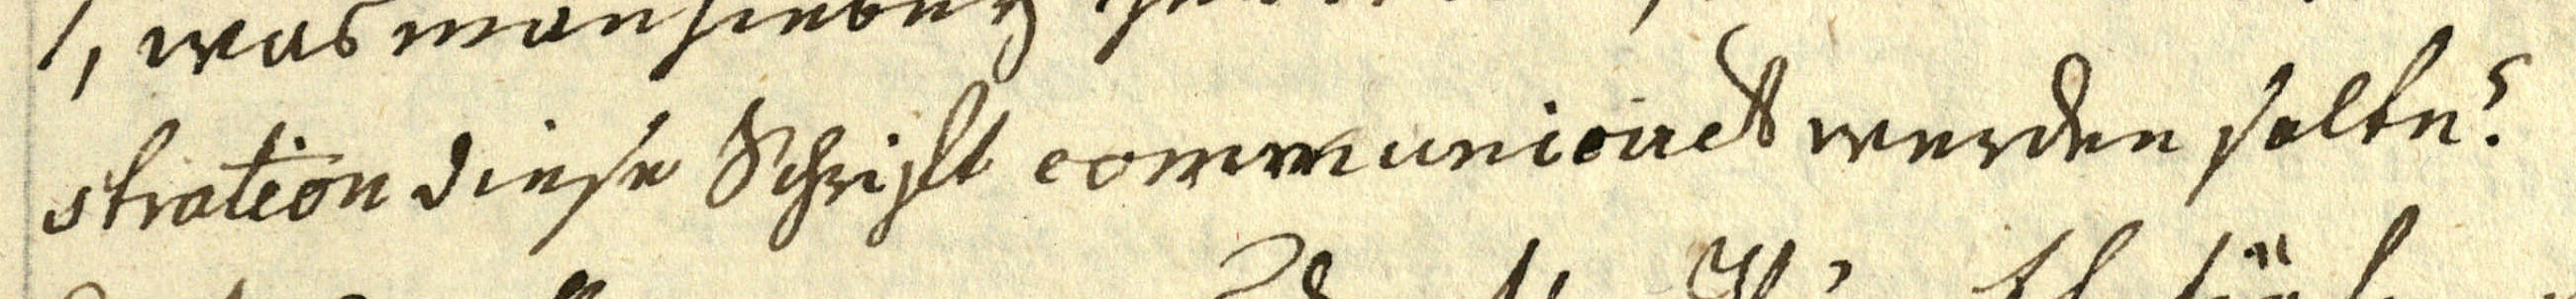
stration diese Schrift communiciret werden solte?
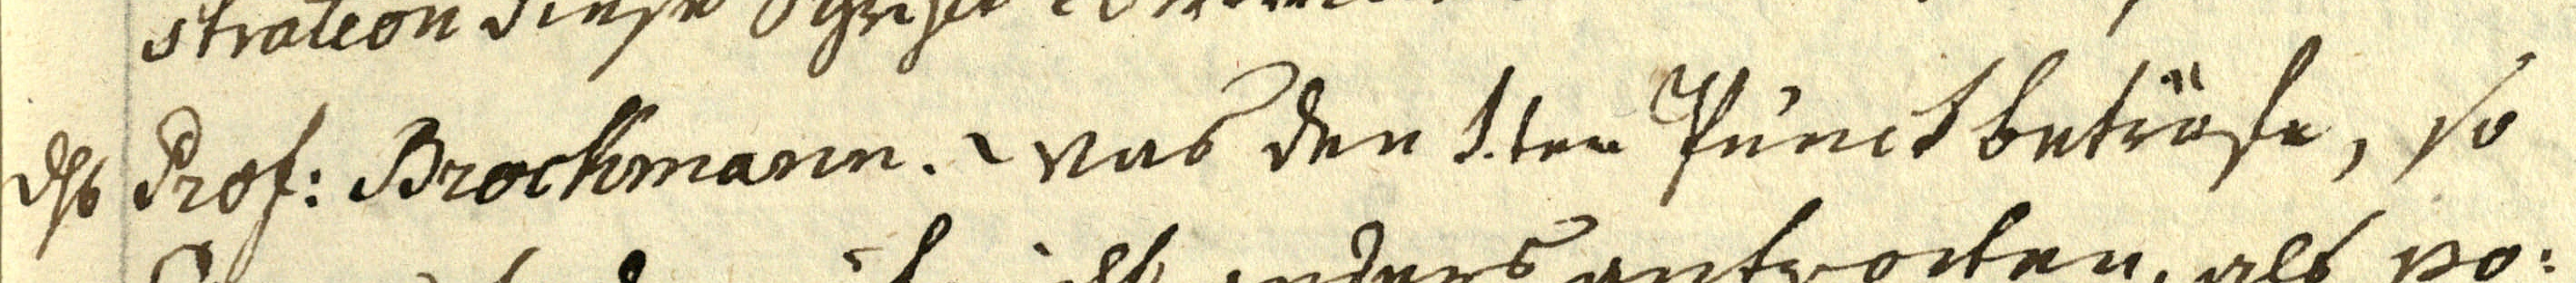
dh Prof. Brockmann. Was den 1 ten Punct beträfe, so
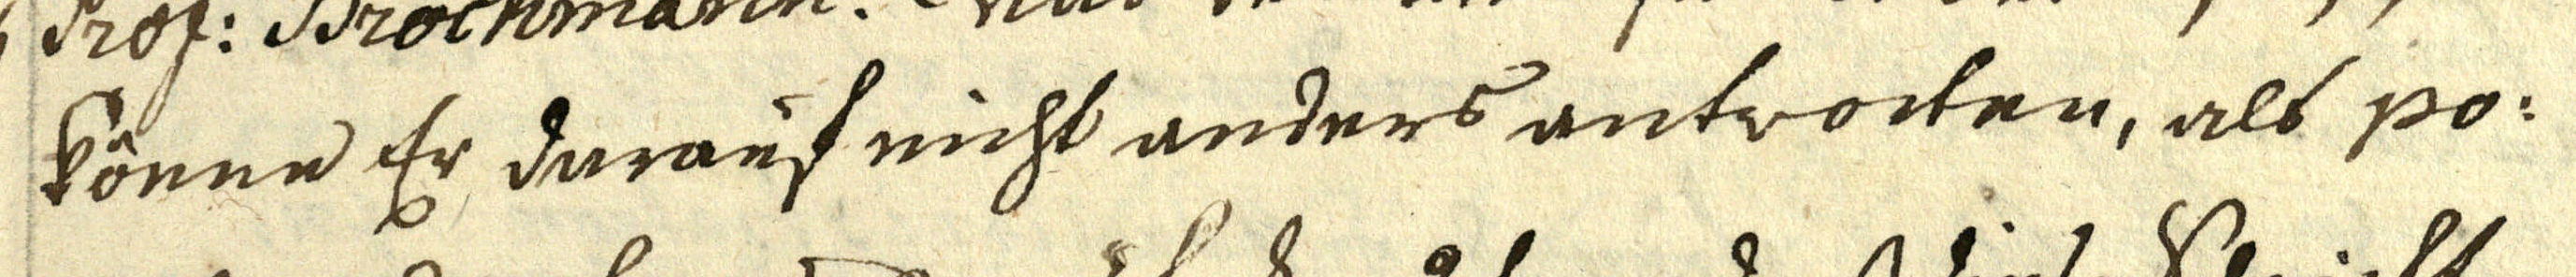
könne Er darauf nicht anders antworten, als po¬
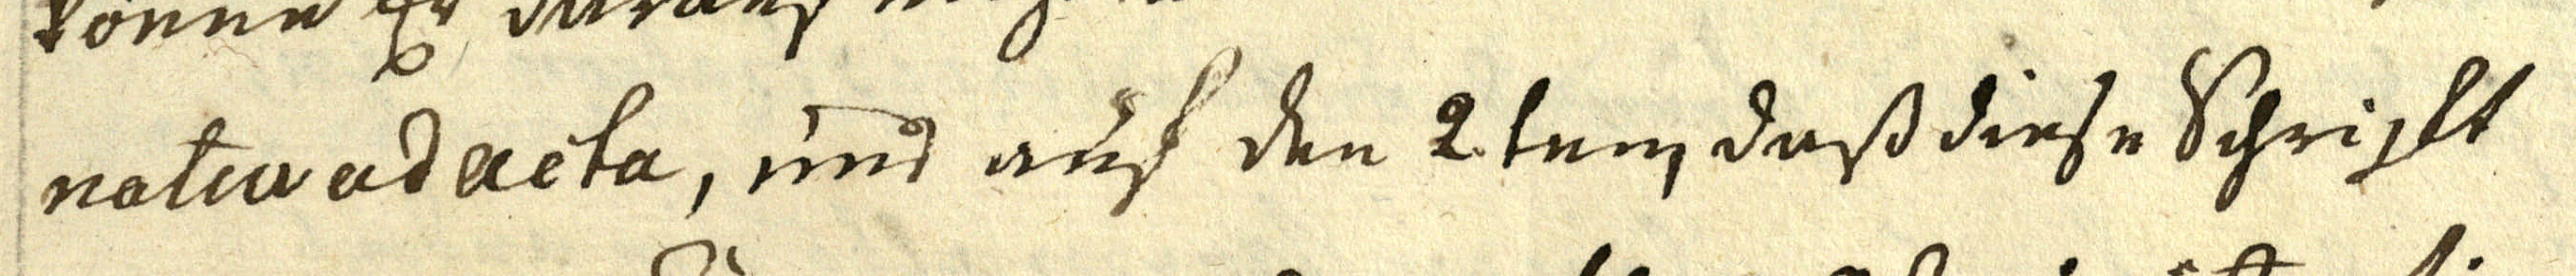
natur ad acta, und auf den 2 ten, daß diese Schrift
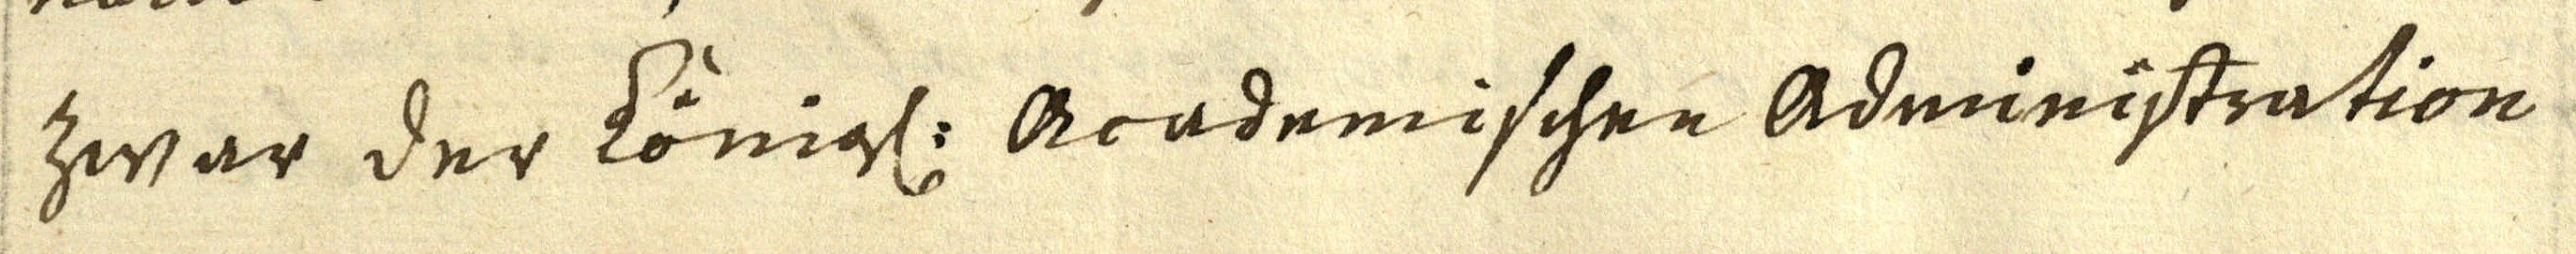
zwar der Königl. Academischen Administration
